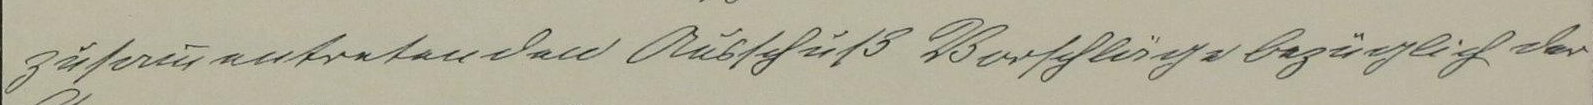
zusammentretenden Ausschuß Vorschläge bezüglich der
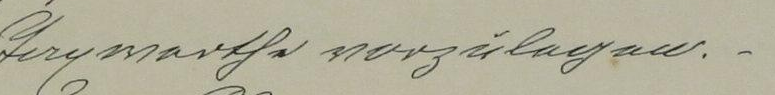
Taxwerthe vorzulegen.
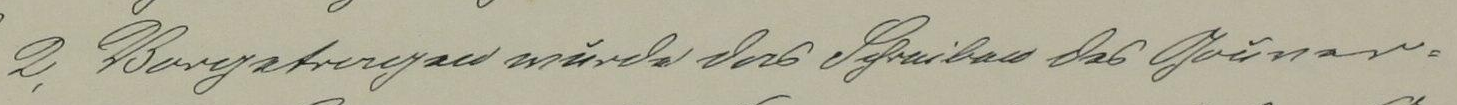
2. Vorgetragen wurde das Schreiben des Gouver-
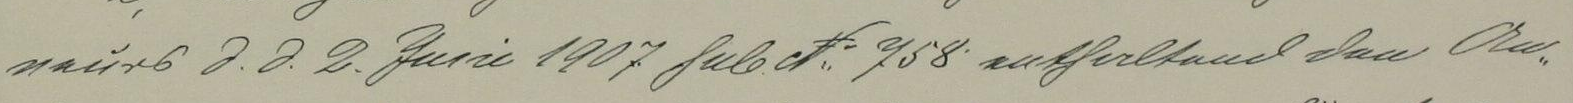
neurs d.d. 2. Juni 1907 sub No. 758 enthaltend den An-
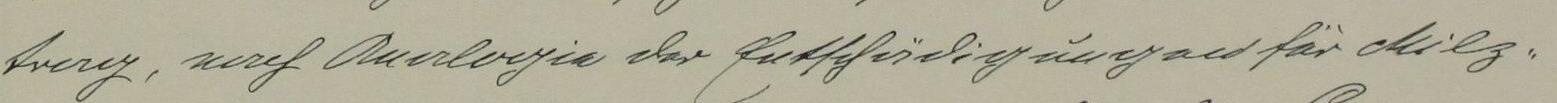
trag, nach Analogie der Entschädigungen für Milz-
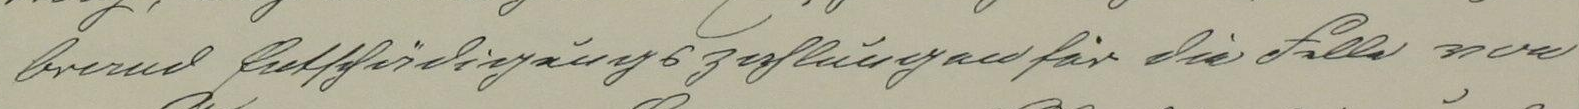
brand Entschädigungszahlungen für die Felle von
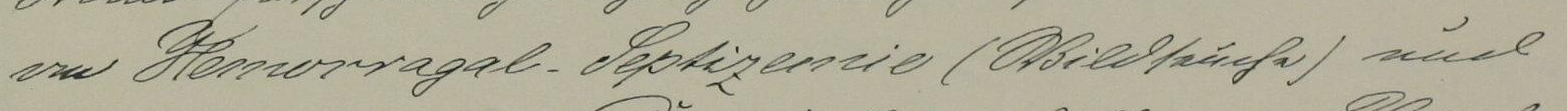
an Haemorragal-Septizemie (Wildseuche) und
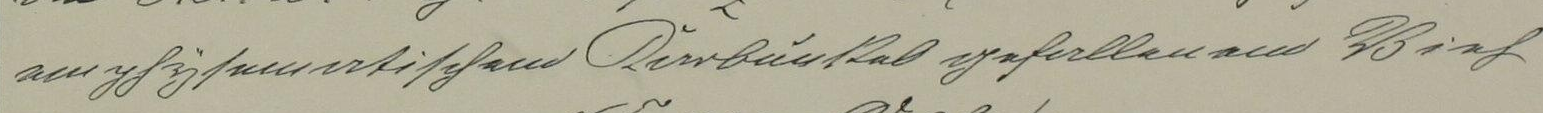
emphysematischem Karbunkel gefallenem Vieh
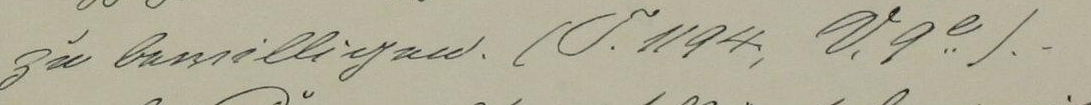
zu bewilligen. (T.1194, V.9e).
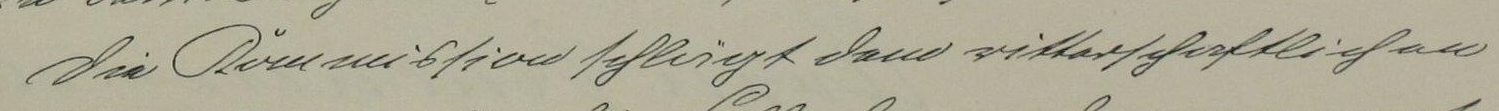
Die Kommission schlägt dem ritterschaftlichen
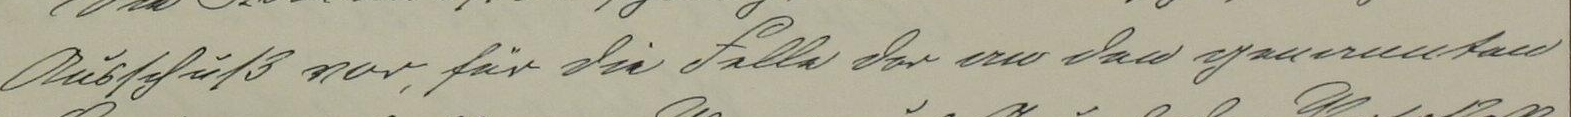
Ausschuß vor, für die Felle der an den genannten
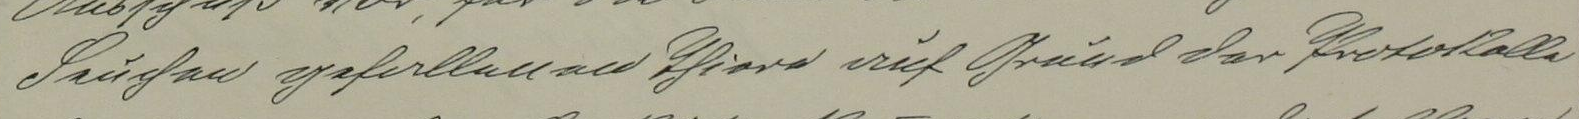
Seuchen gefallenen Thiere auf Grund der Protokolle
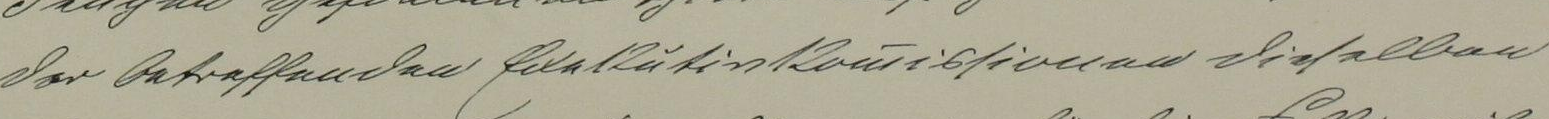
der betreffenden Exekutivkommissionen dieselben
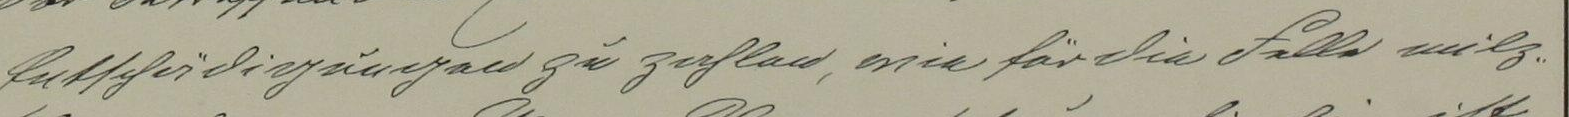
Entschädigungen zu zahlen, wie für die Felle milz-
